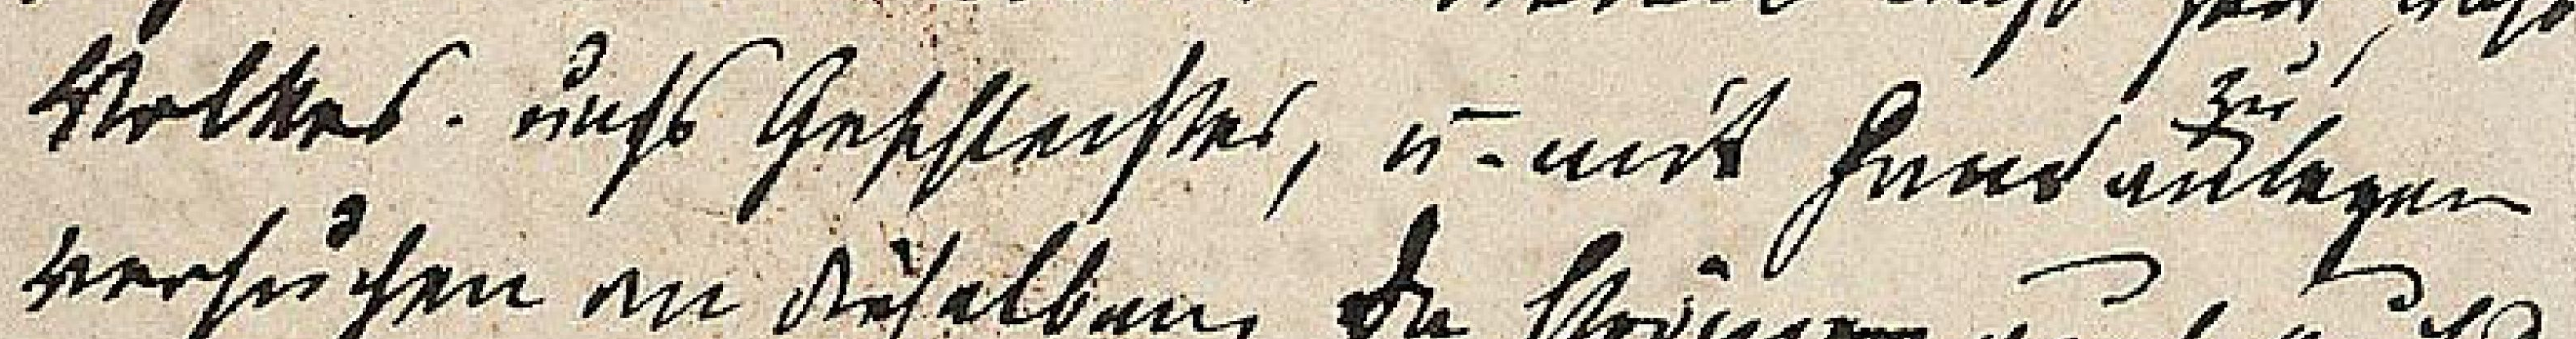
Volkes. unss Geschlechtes, u. mit handanlegen
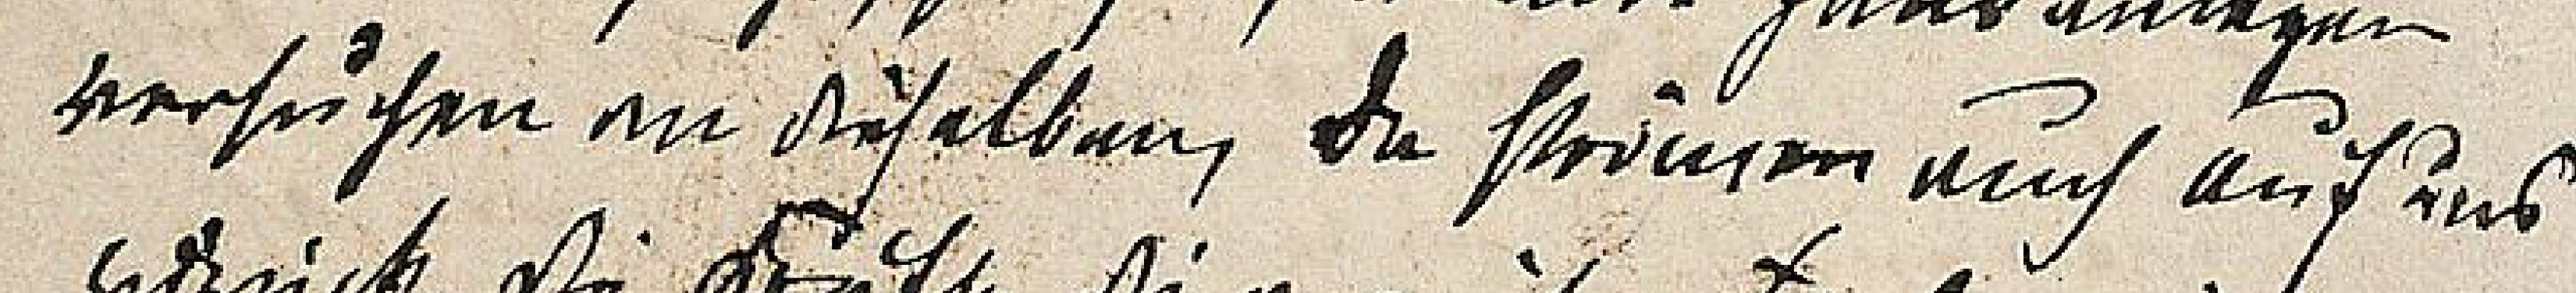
versuchen an dieselben, da strömen auch auf uns
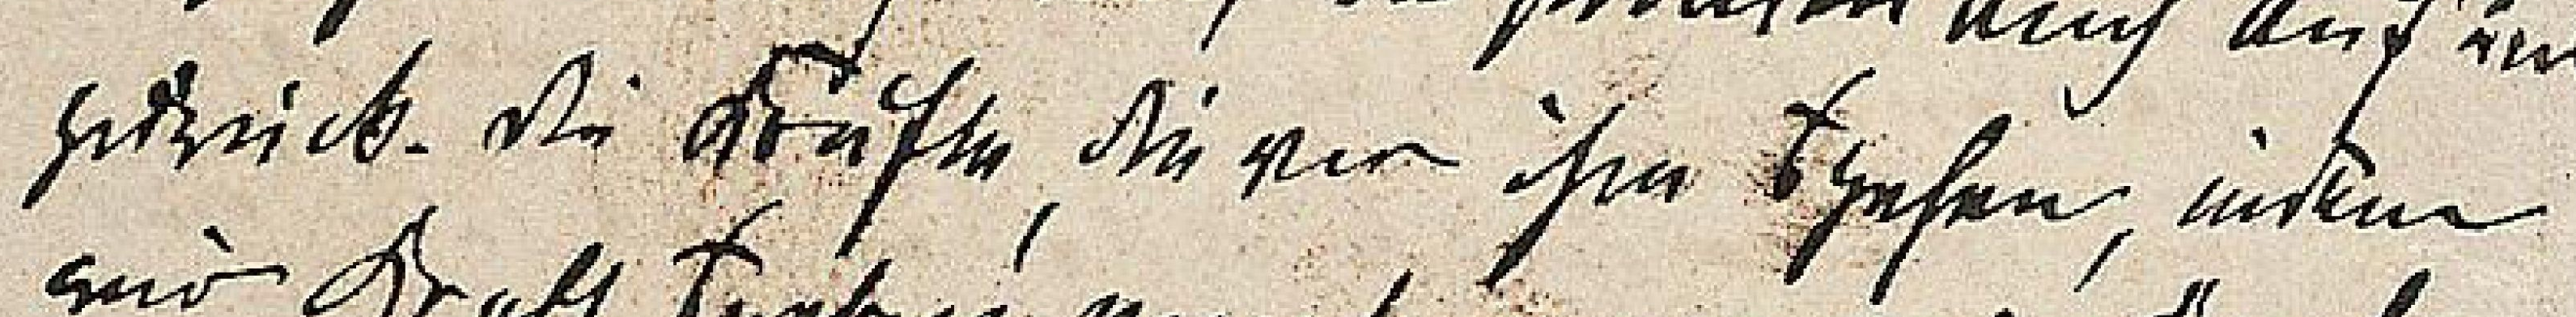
zurück die Kräfte, die von ihm sgehen, indem
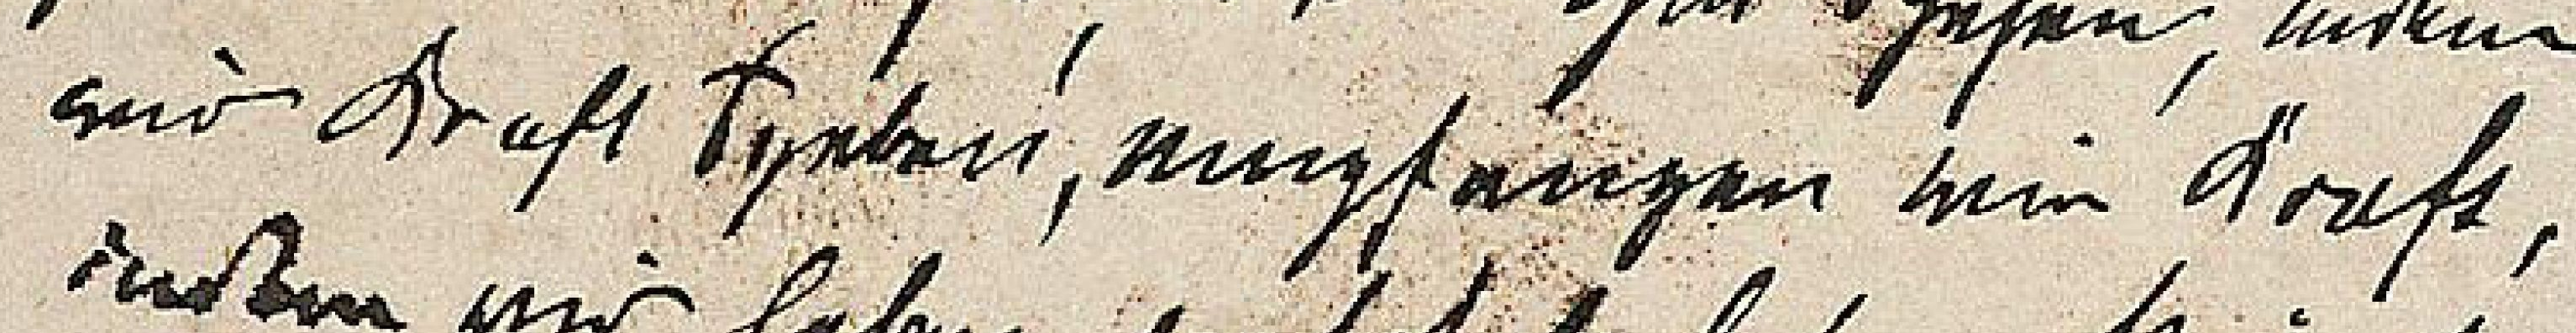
wir Kraft sgeben, empfangen wir Kraft,
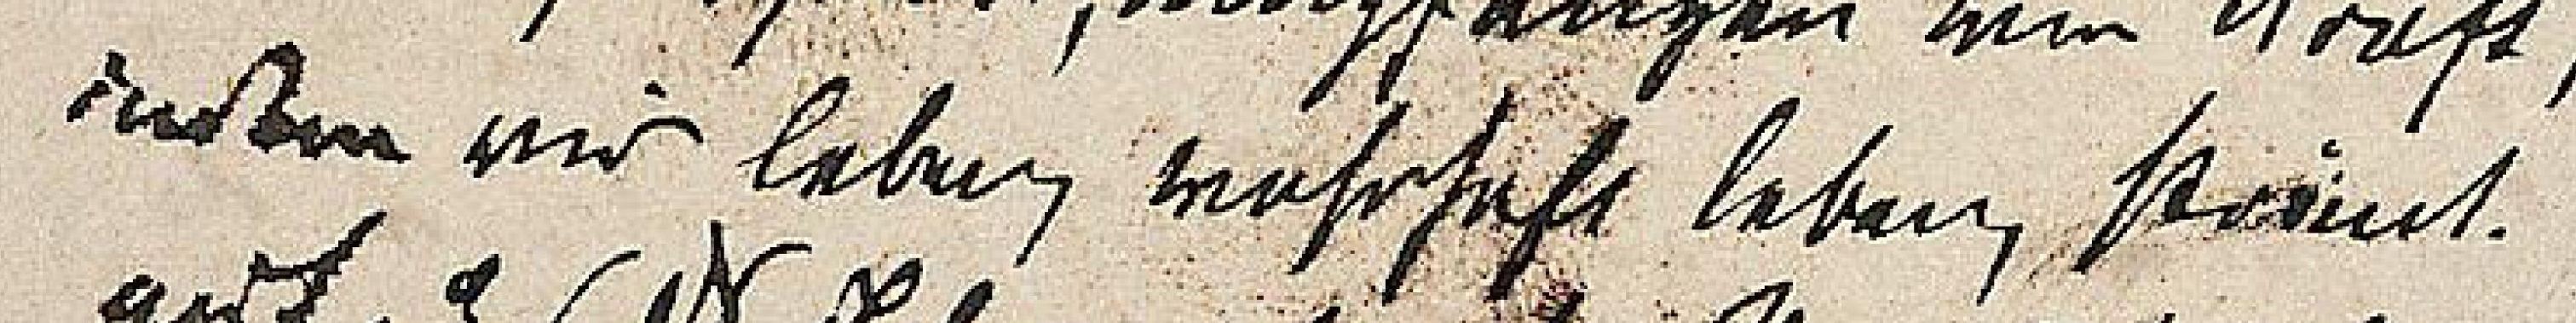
indem wir leben, wahrhaft leben, strömt.
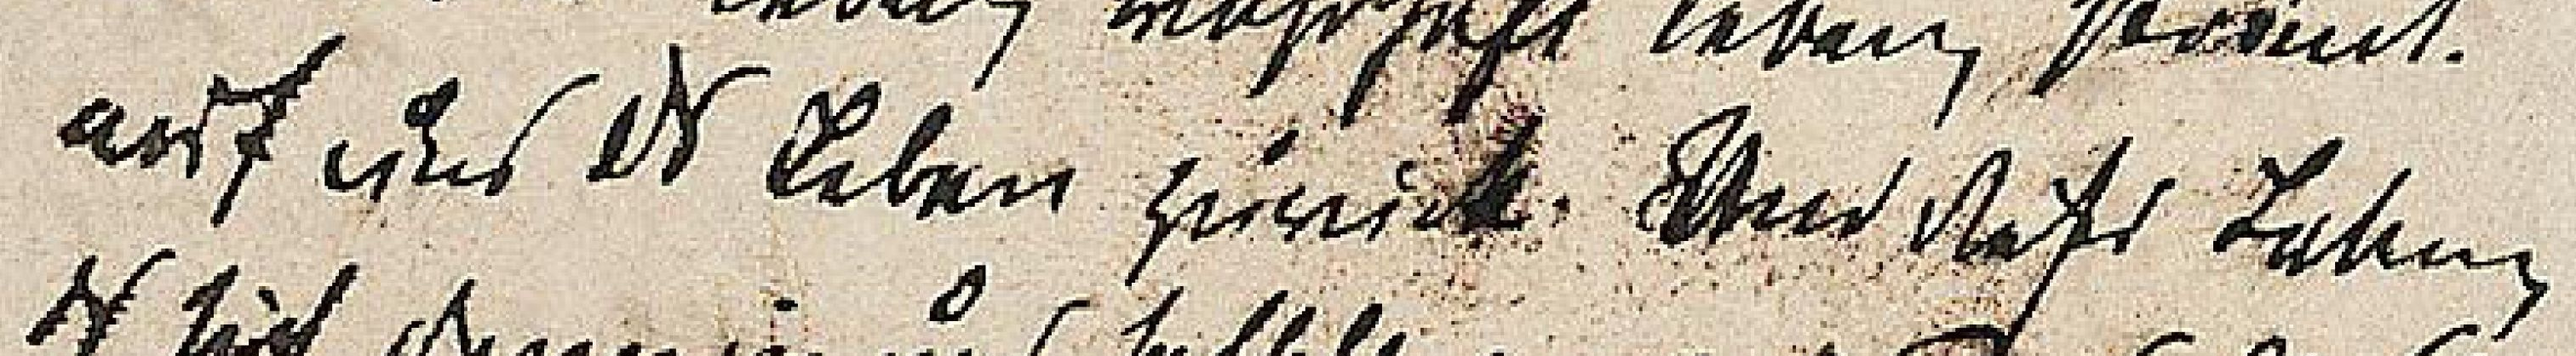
auf uns des Leben zurück: Und diess Leben,
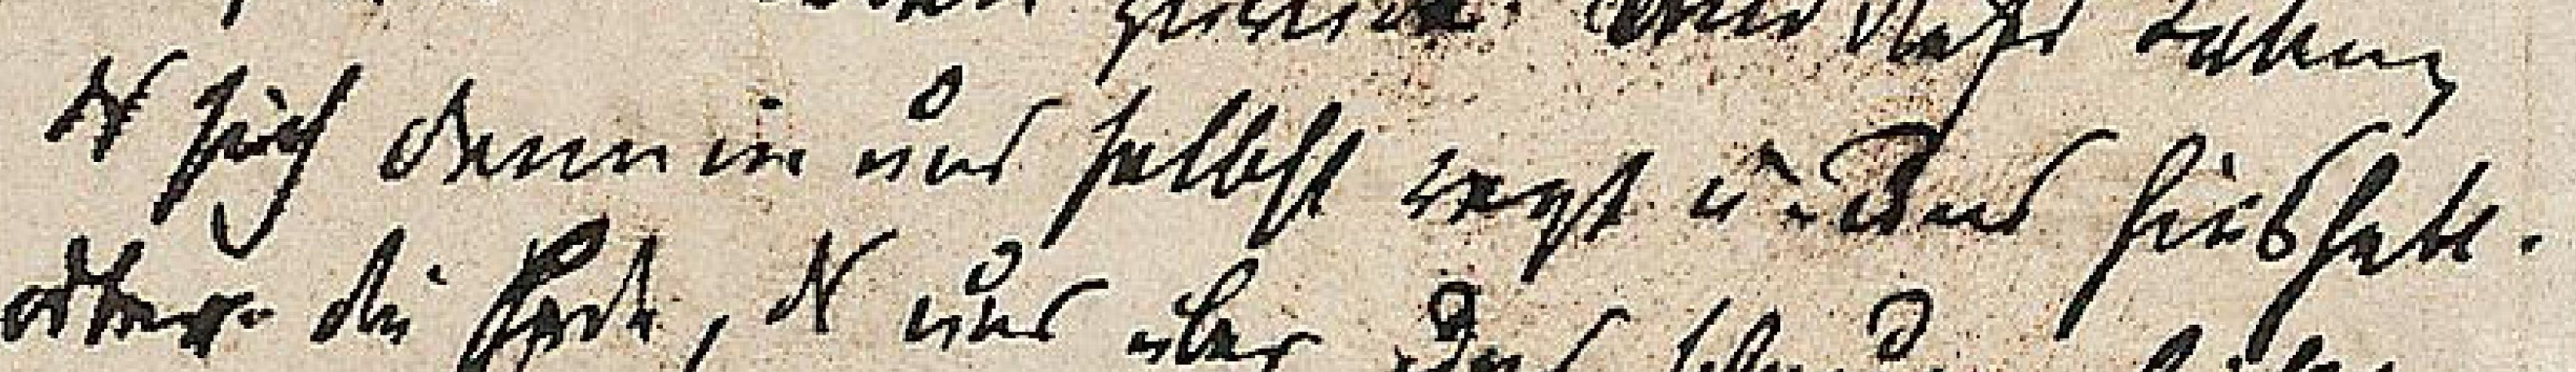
ds sich dann in uns selbst regt u. uns hinshebt.
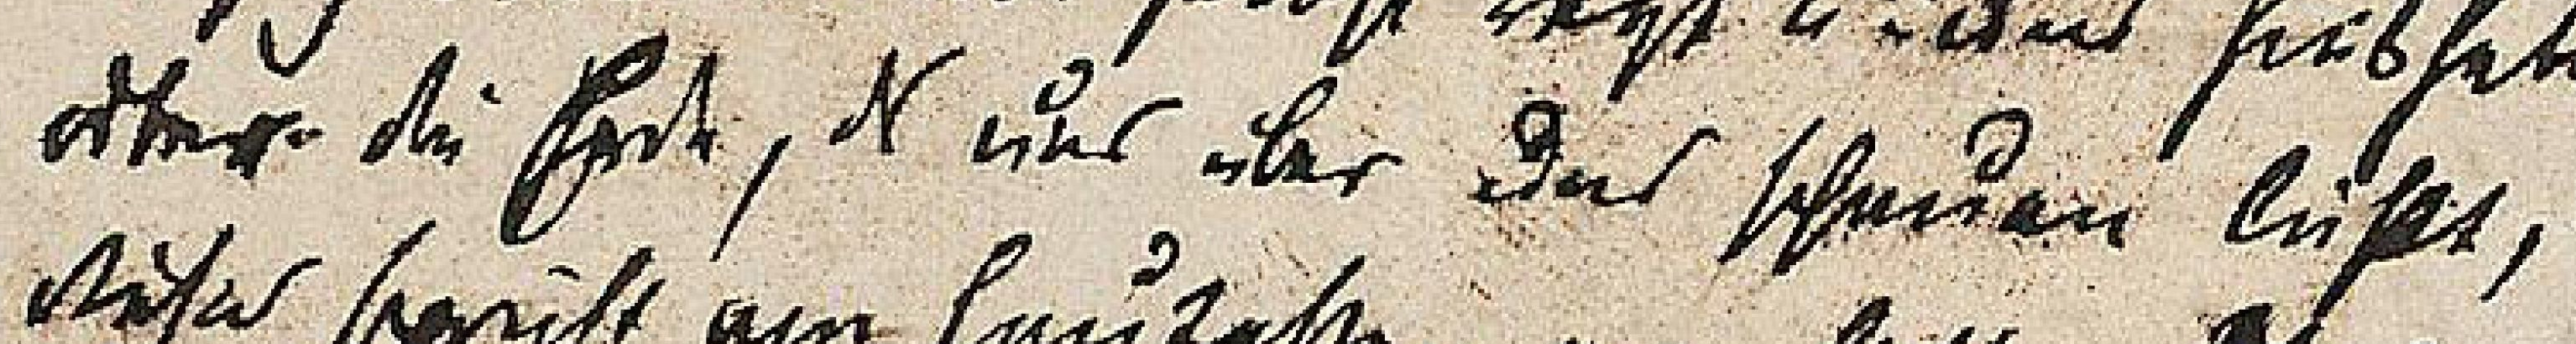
über der Erde, ds uns über uns schauen läßt,
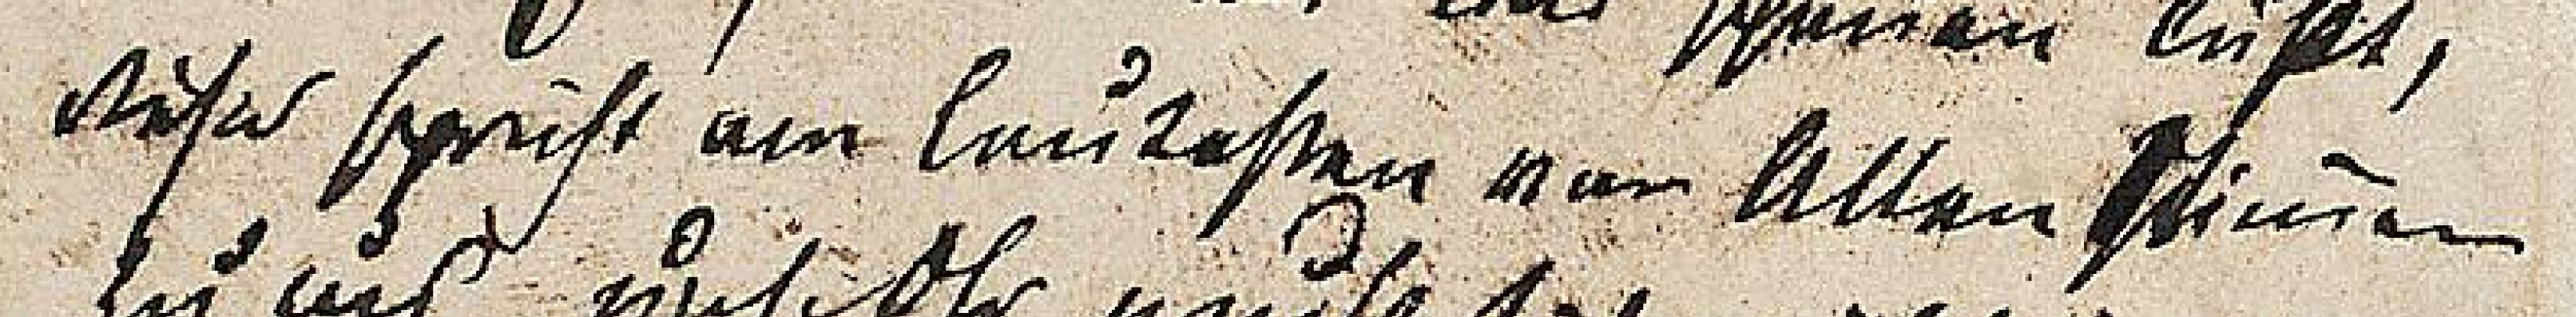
dieses spricht am lautesten von Allen Stimen
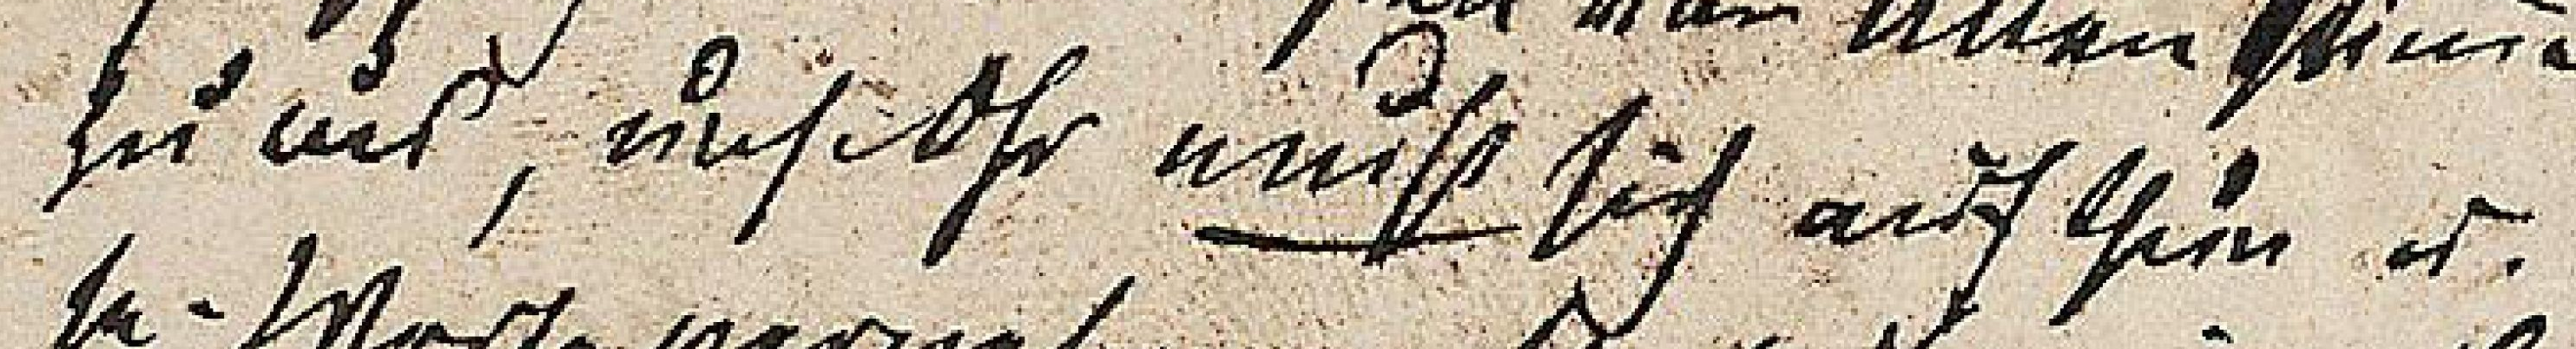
zu uns, uns Ohr muß sich aufthun u.
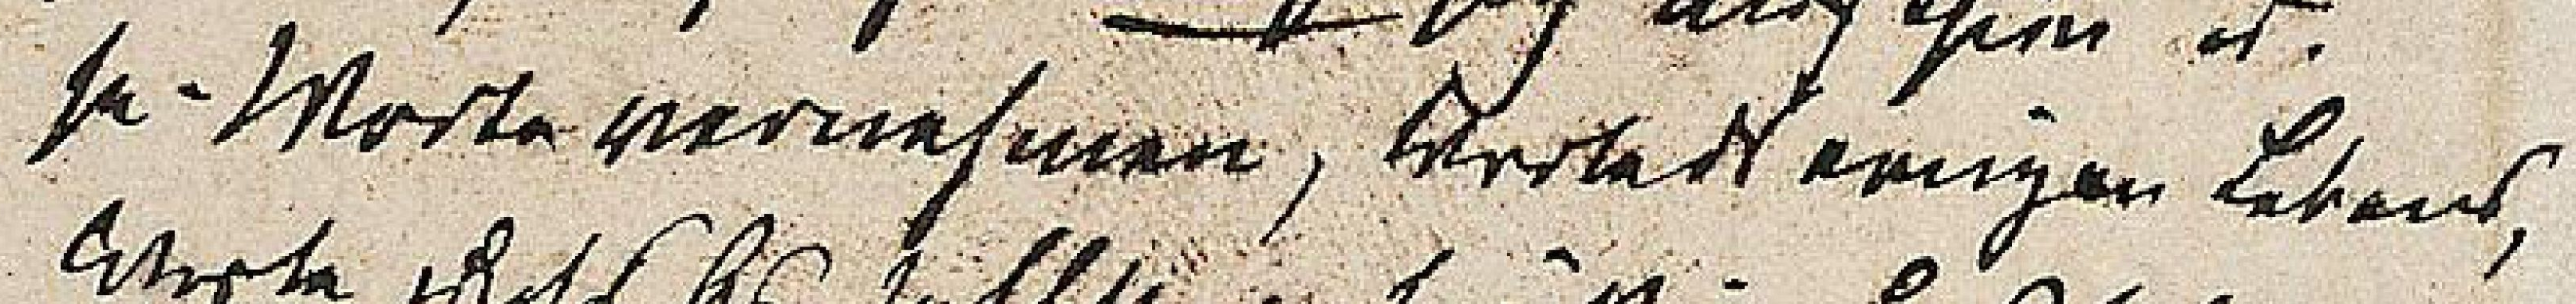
sn Worte vernehmen, Worte ds ewigen Lebens,
